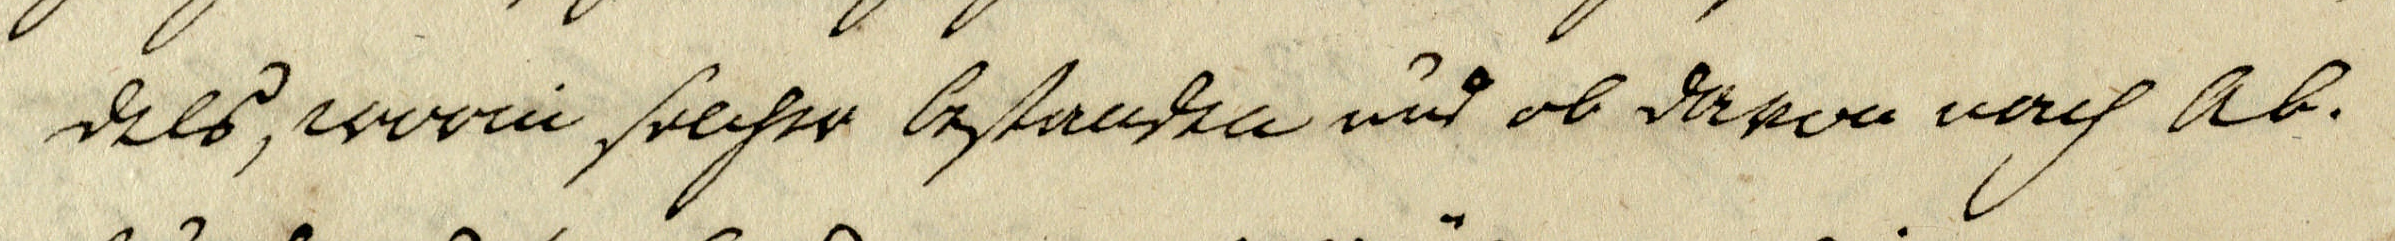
dels, worin solcher bestanden und ob davon nach Ab¬
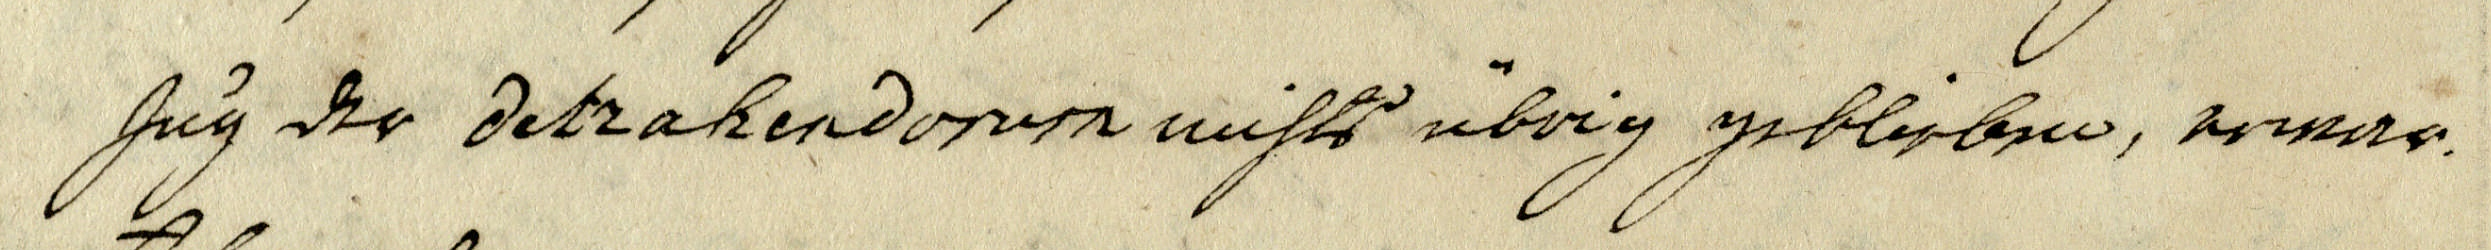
zur der detrahendorum nichts übrig geblieben, erwar¬
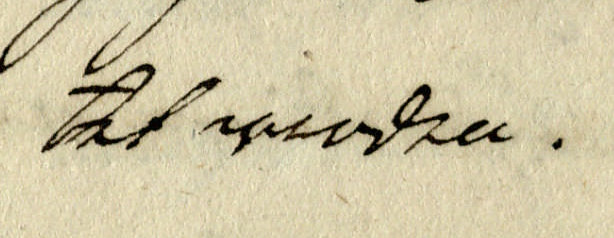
tet werden.
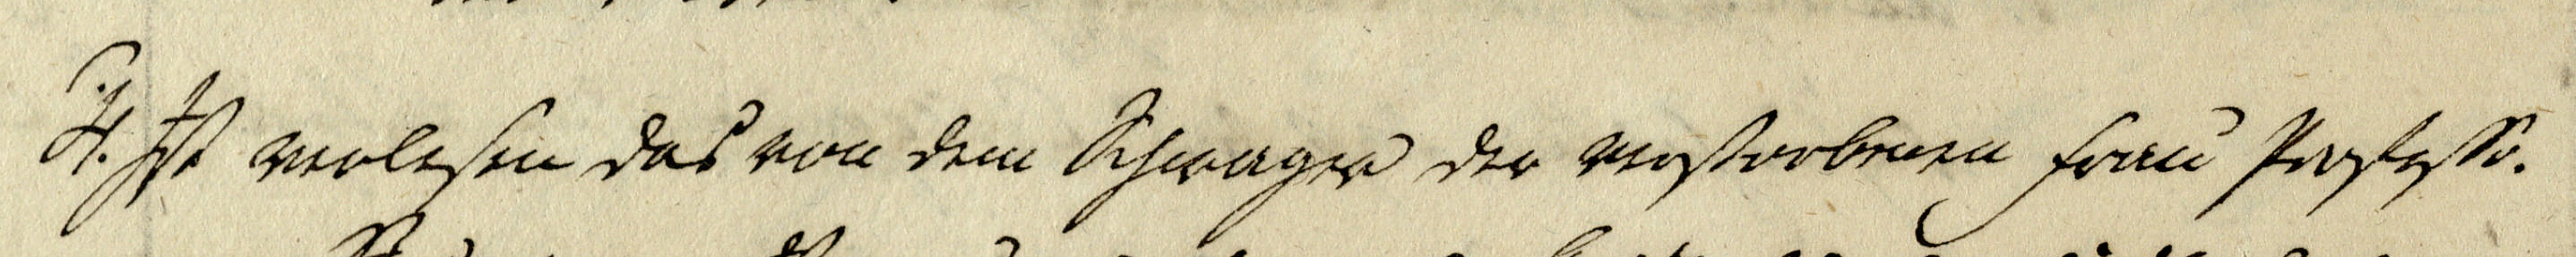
4. Ist verlesen das von dem Schwager der verstorbenen Frau Professo¬
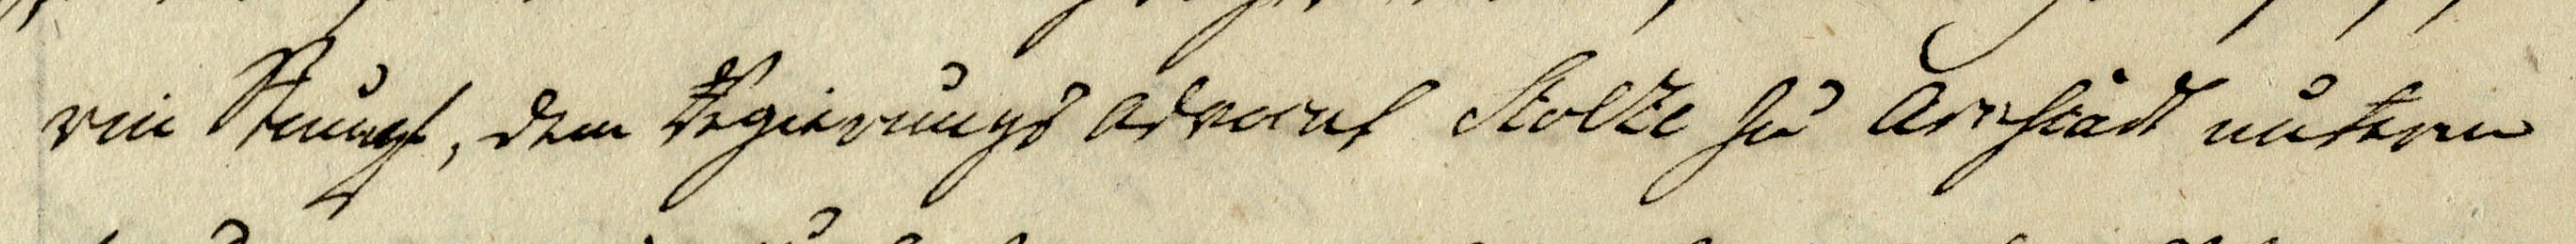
rin Stumpf, dem Regierungsadvocat Stolze zu Arnstädt unterm
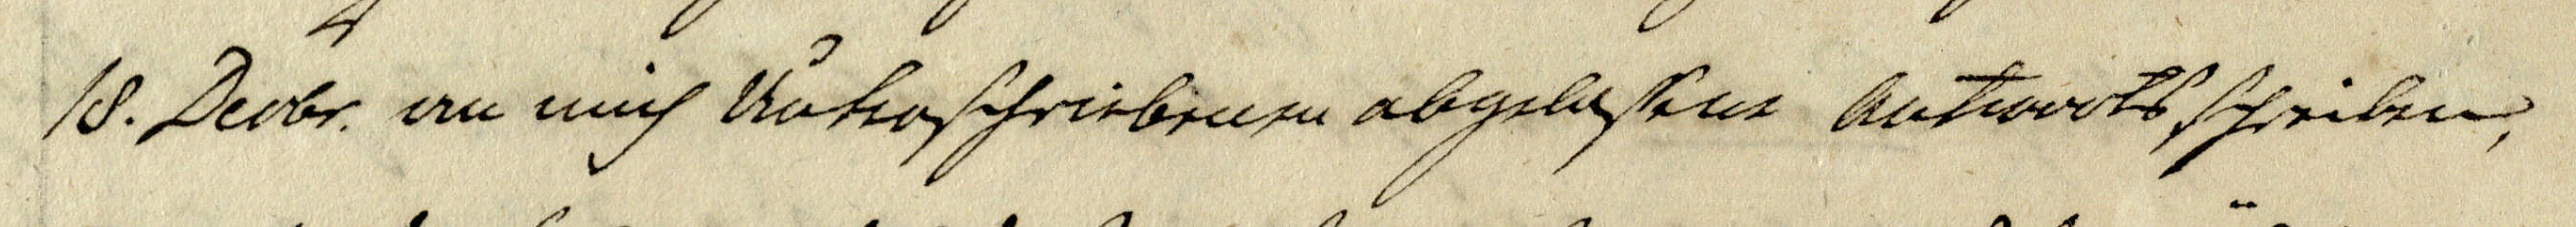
18. Decbr. an mich Unterschriebenen abgelassene Antwortsschreiben,
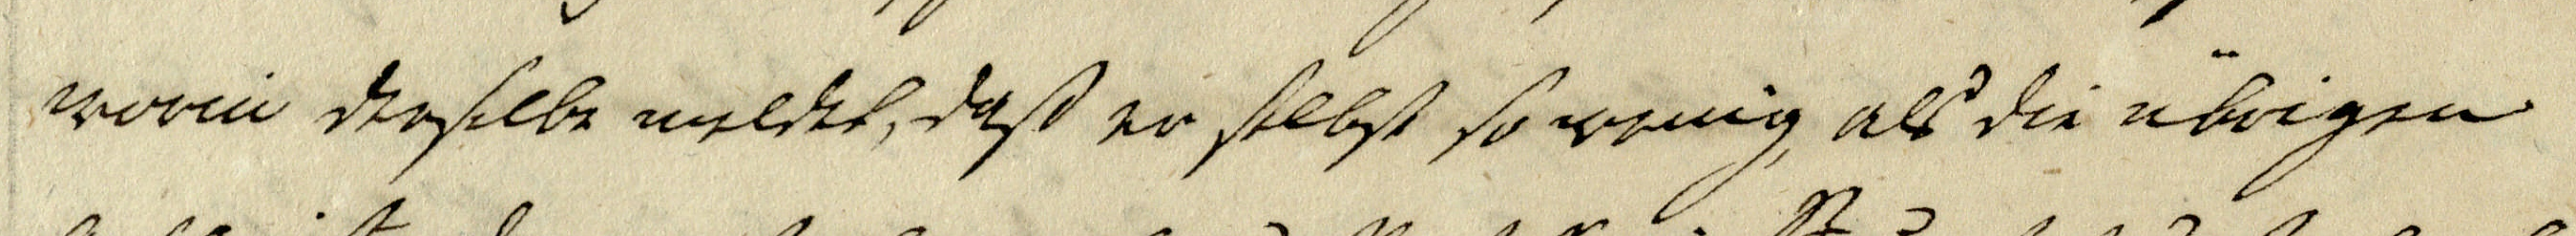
worin derselbe meldet, daß er selbst so wenig als die übrigen
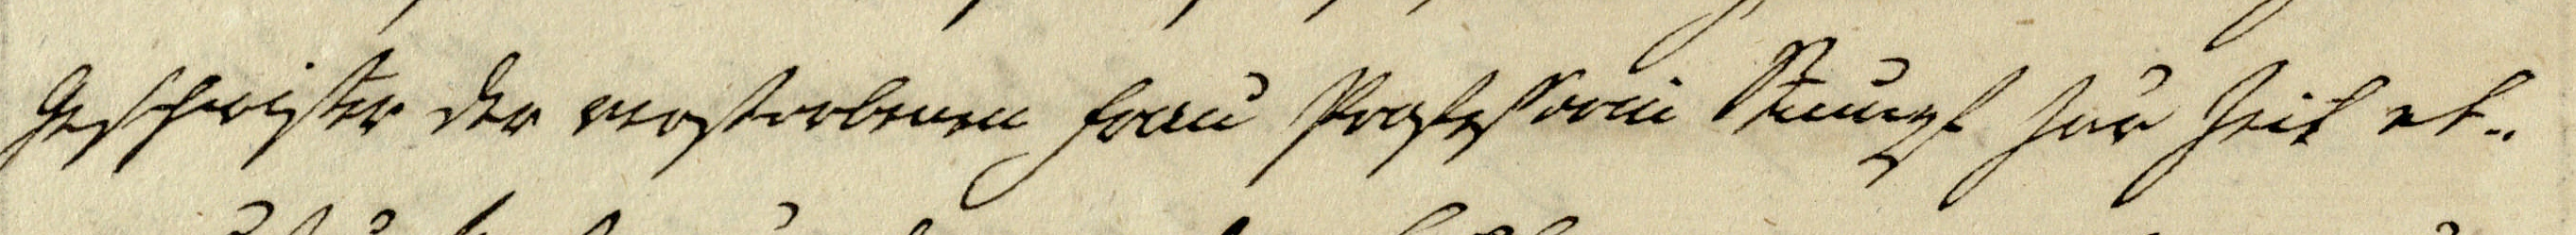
Geschwister der verstorbenen Frau Professorin Stumpf zur Zeit et¬
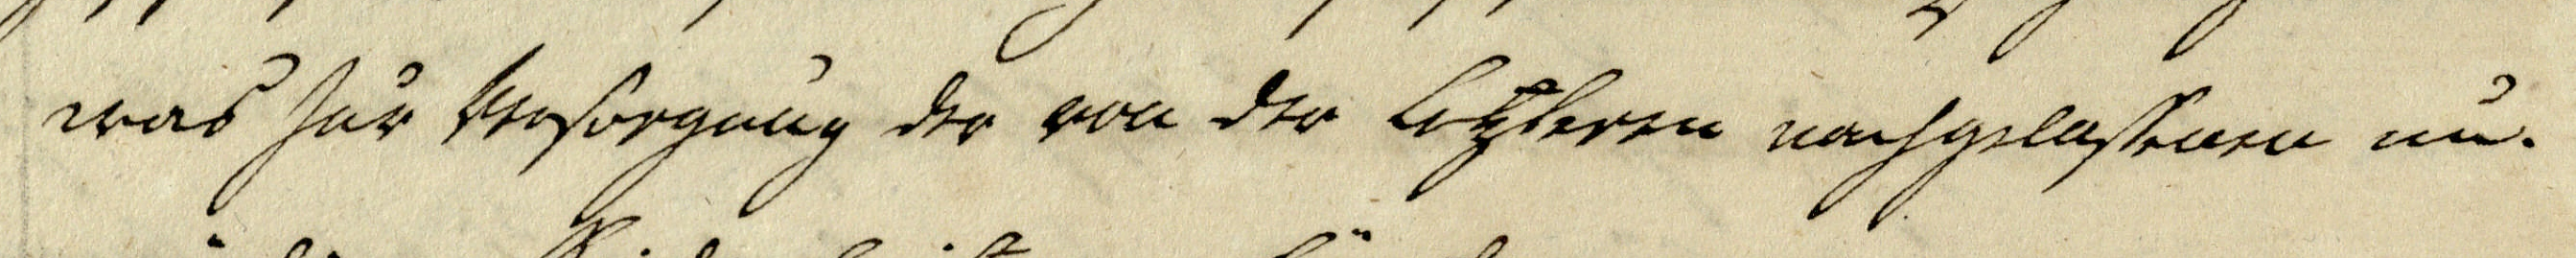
was zur Versorgung der von der Letzteren nachgelassenen un¬
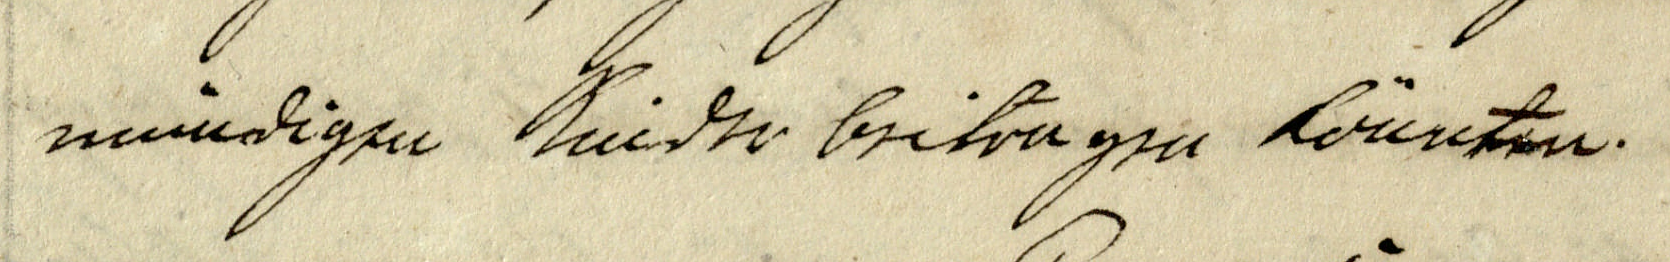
mündigen Kinder beitragen könnten.
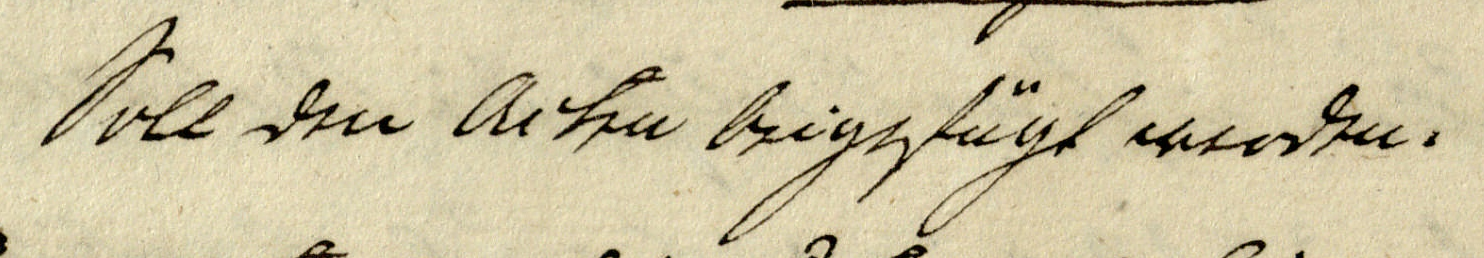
Soll den Acten beigefügt werden.
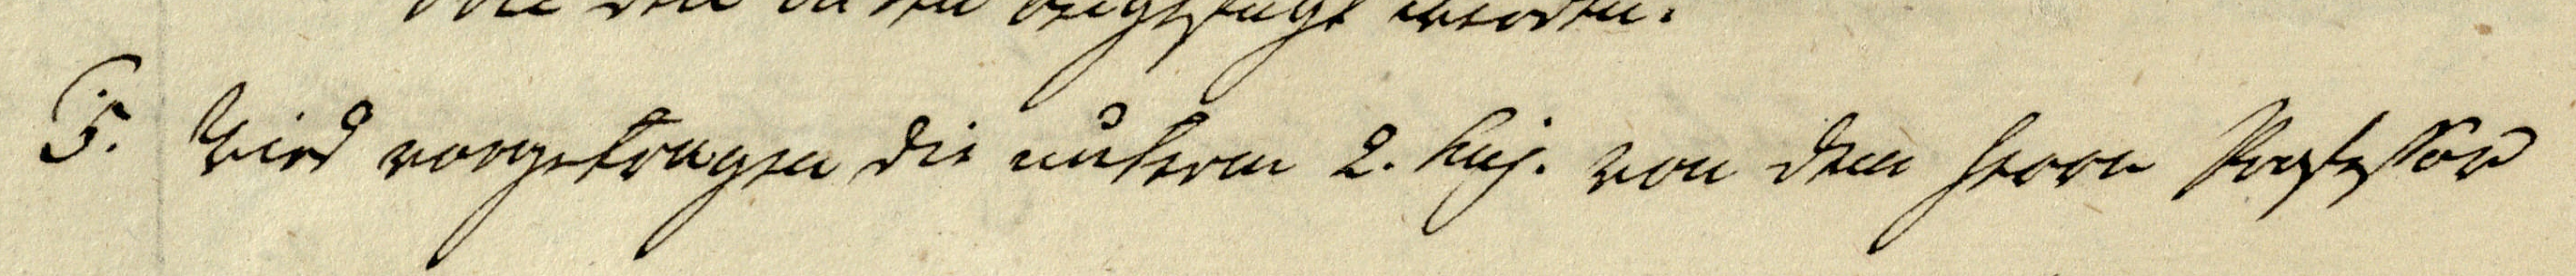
5. Wird vorgetragen die unterm 2. huj. von dem Herrn Professor
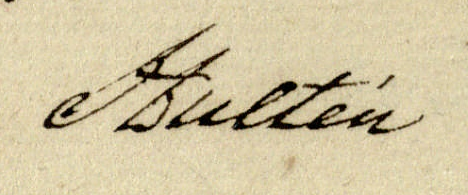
Hultén
